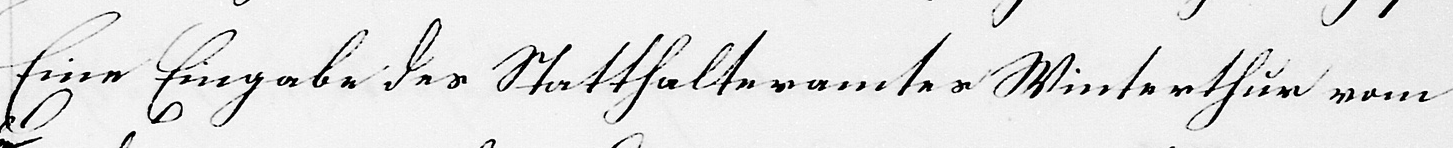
Eine Eingabe des Statthalteramtes Winterthur vom
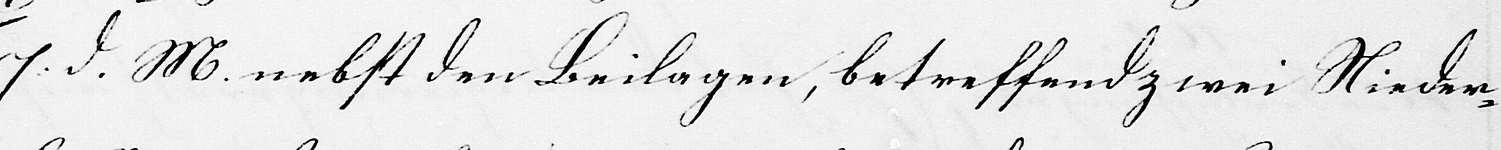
7. d. M. nebst den Beilagen, betreffend zwei Nieder¬
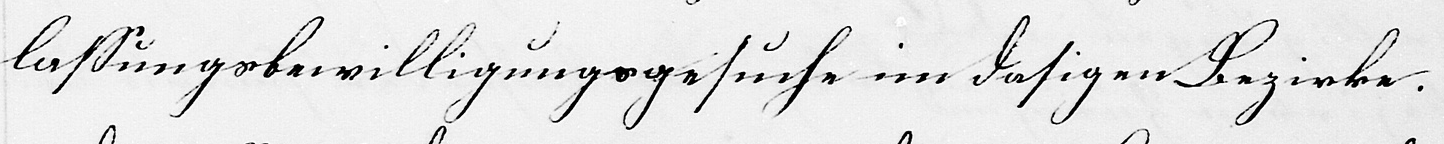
laßungsbewilligungsgesuche im dasigen Bezirke.
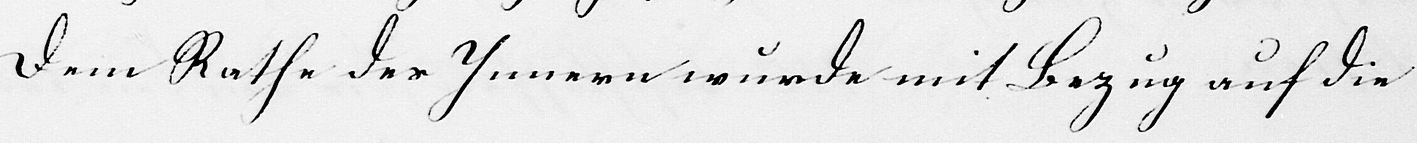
Dem Rathe des Innern wurde mit Bezug auf die
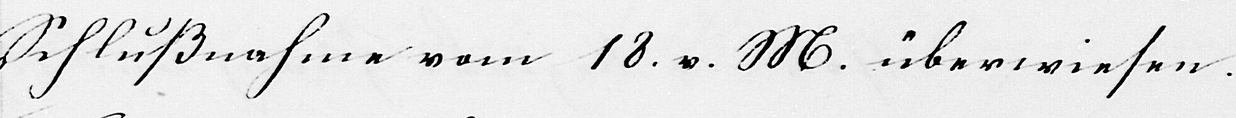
Schlußnahme vom 18. v. M. überwiesen.
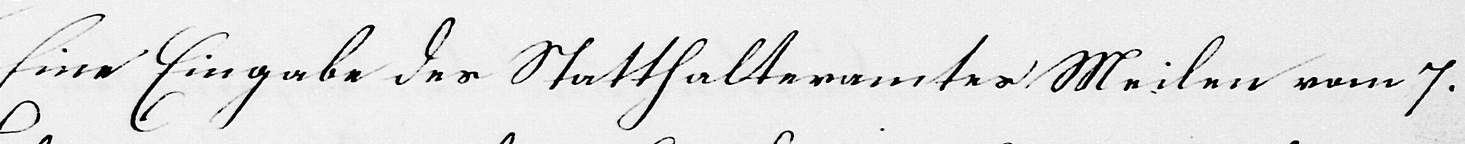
Eine Eingabe des Statthalteramtes Meilen vom 7.
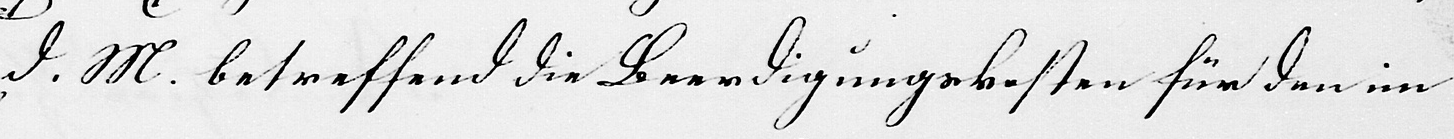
d. M. betreffend die Beerdigungskosten für den im
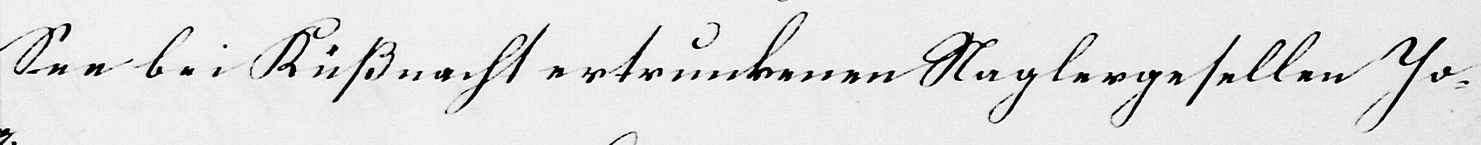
See bei Küßnacht ertrunkenen Naglergesellen Jo¬
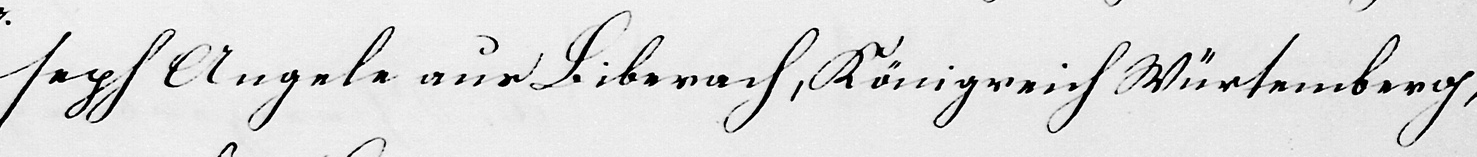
seph Angele aus Biberach, Königreich Würtemberg,
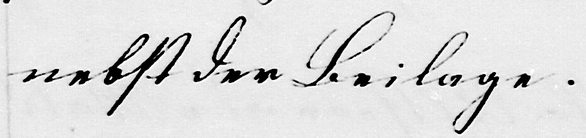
nebst der Beilage.
